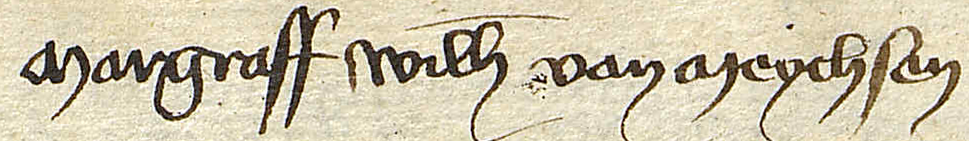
Margraff wilh* von Meychſen
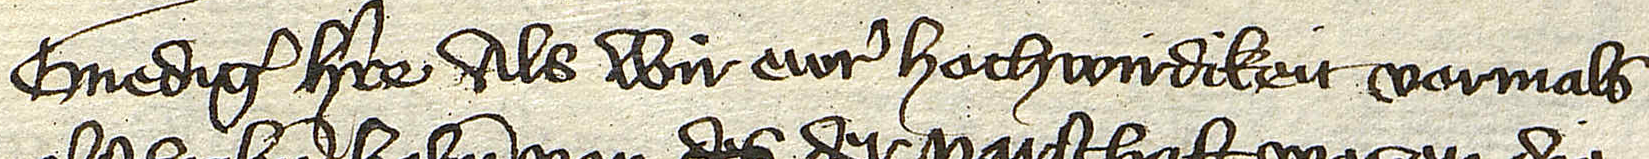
Gnedig* h*re Als wir ewr* hochwirdikeit vormals
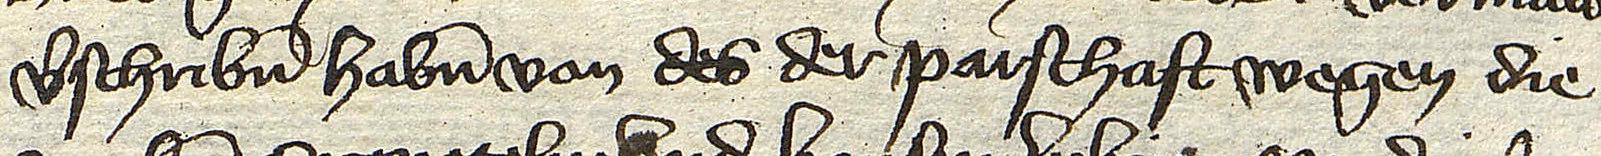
v*ſchrib*n hab*n von des der parſchaft wegen die
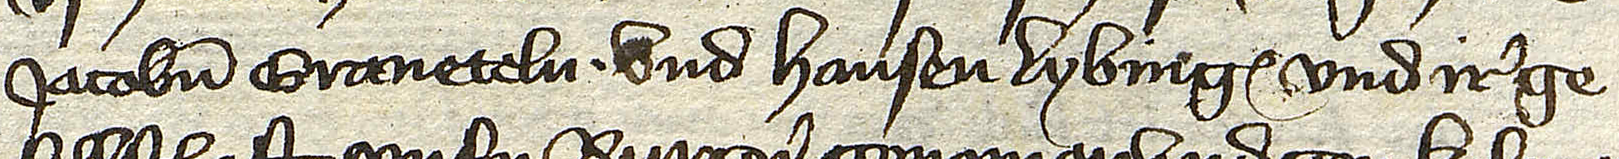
Iacob*n Graneteln . vnd hanſen lybing* vnd ir* ge
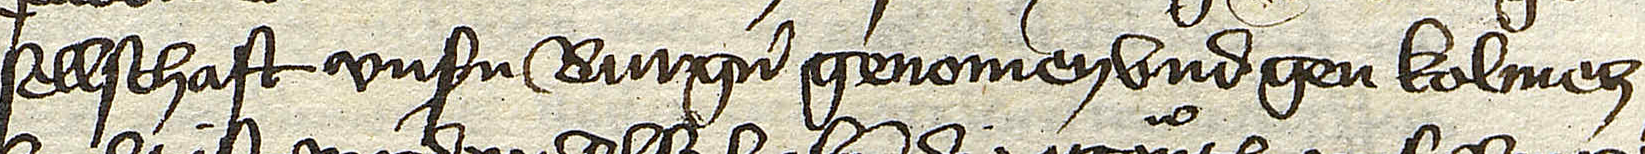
ſellſchaft vnſ*n Burg*n genomen vnd gen kolmecʒ
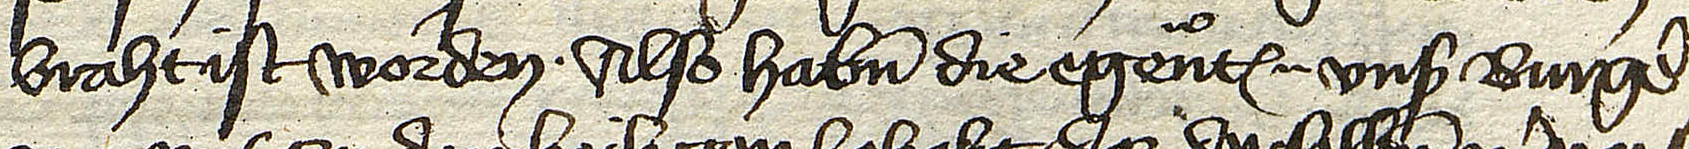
braht iſt worden . Alſo habe*n die egen*t* ~ vnſ* Burge*
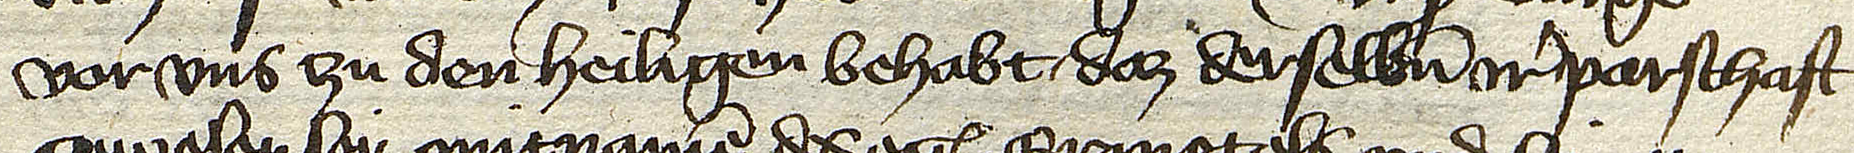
vor vns cʒu den heiligen behabt / daʒ derſelb*n ir* parſchaft
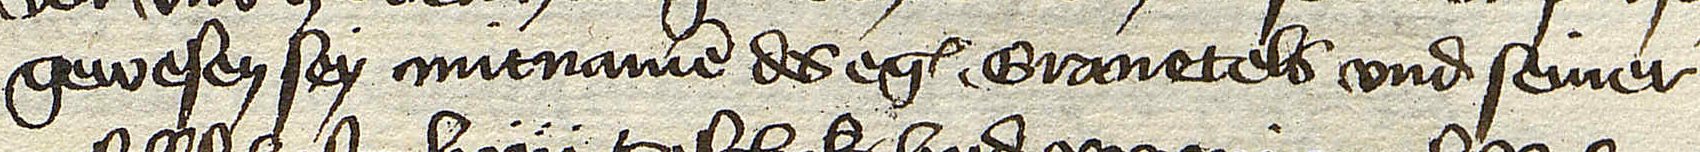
geweſen ſey mitname* des eg* . Granetels vnd ſeiner
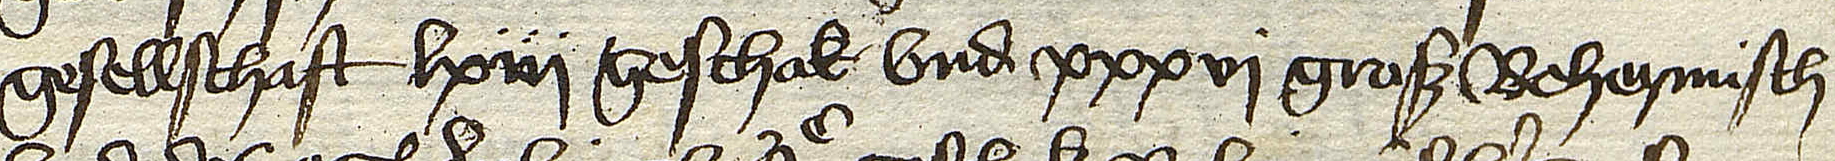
geſellſchaft lxiii geſchok vnd xxxvi groſʒ Beheymiſch
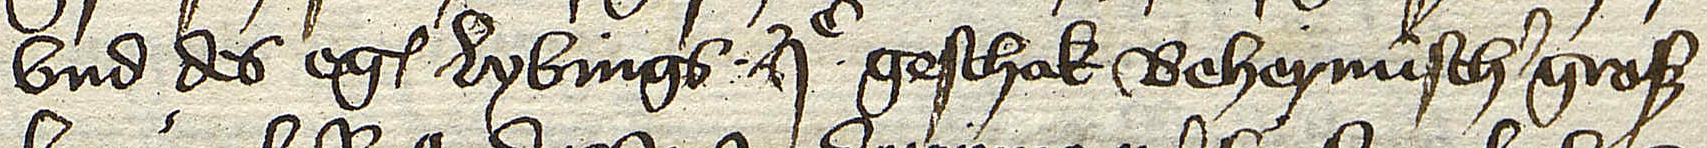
vnd des eg* lybings . I* . geſchok Beheymiſch* groſʒ
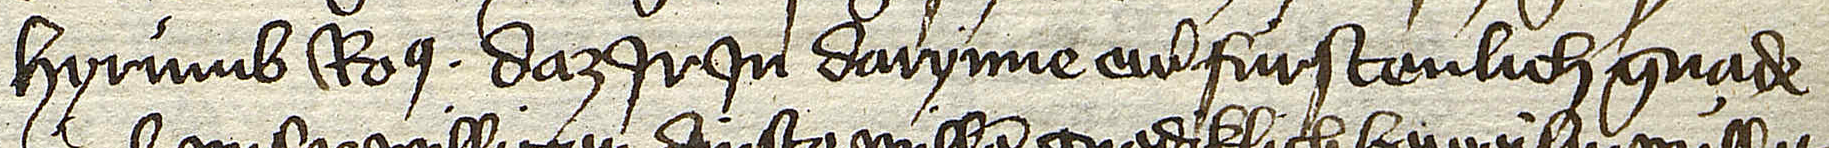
hyrümb Ro* . daʒ Ir In darynne ew* fürſtenlich gnade
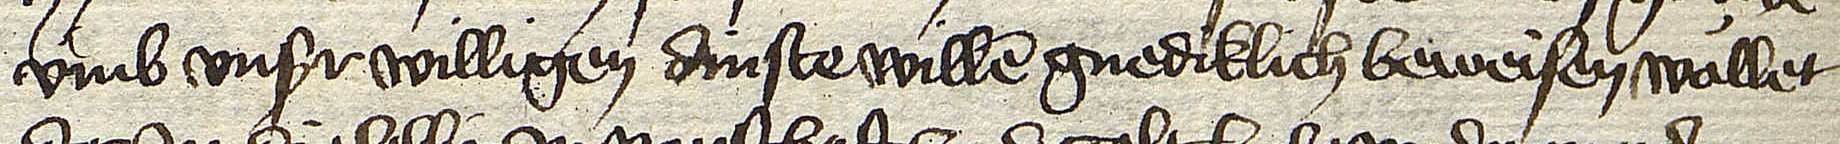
v̈mb vnſ*r willigen dinſte wille* gnediklich beweiſen wöllet
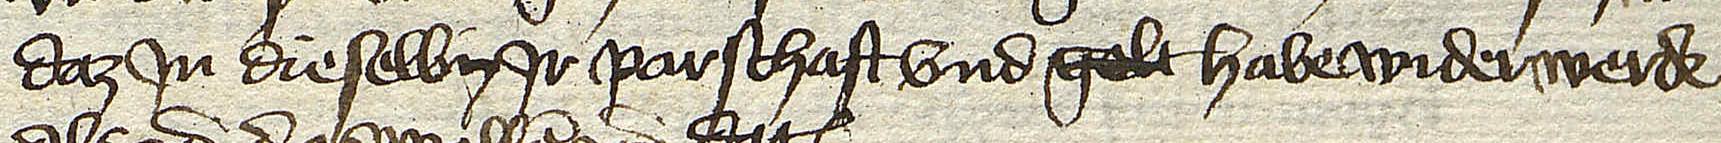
daʒ In dieſelb*n Ir parſchaft vnd gelt habe wider werde
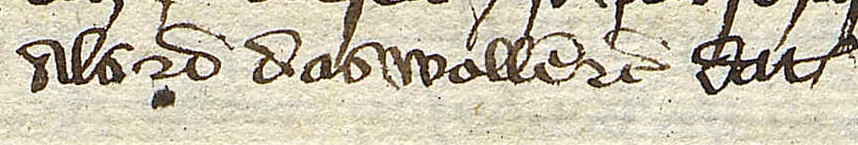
Als ec* das wölle* ec* dat*
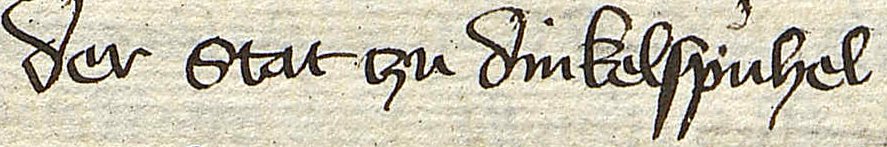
Der Stat cʒu Dinkelſpühel
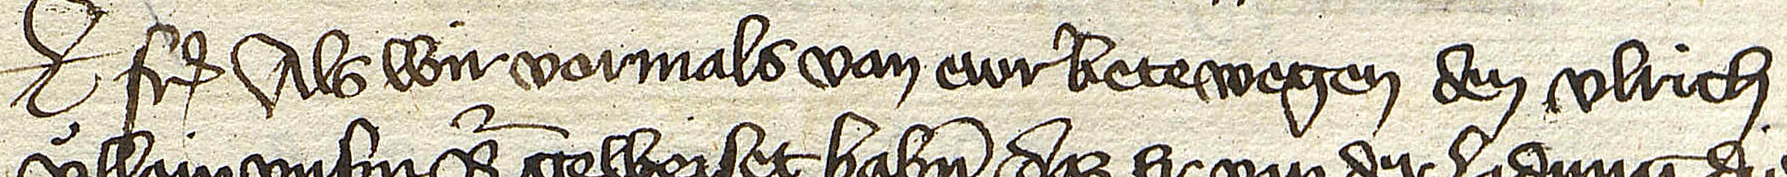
L* fr* Als wir vormals von ewr* bete wegen den vlrich
